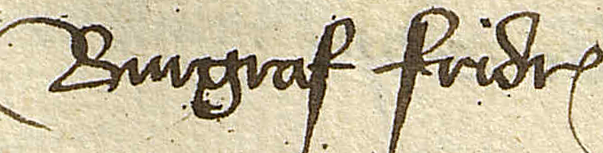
Burgraf Fridr*
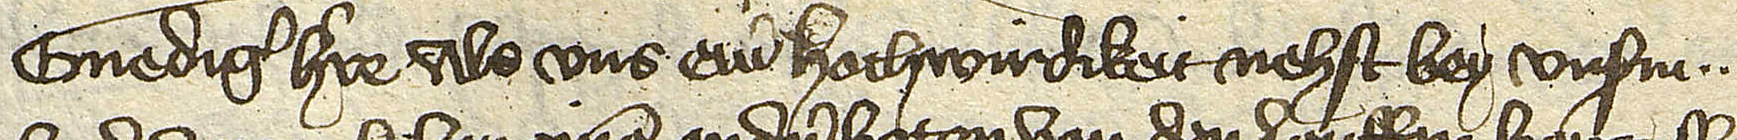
Gnedig* h*re / Als vns ew* hochwirdikeit nehſt bey vnſ*m ~
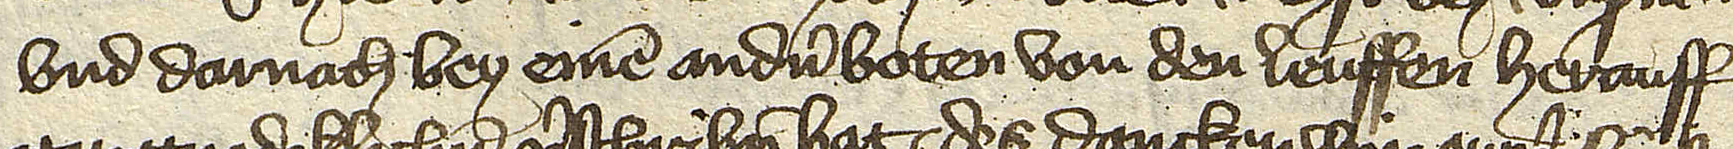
vnd darnach bey eine* andn* boten von den leuffen herauff
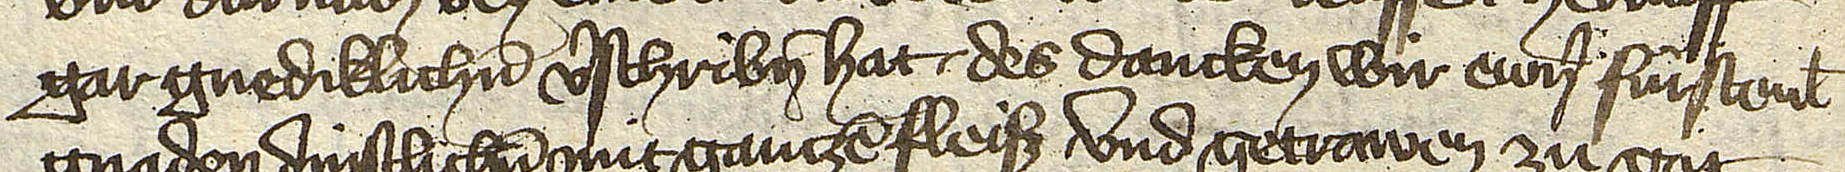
gar gnediklichn* v*ſchribn* hat / des dancken wir ewn* fürſtenl*
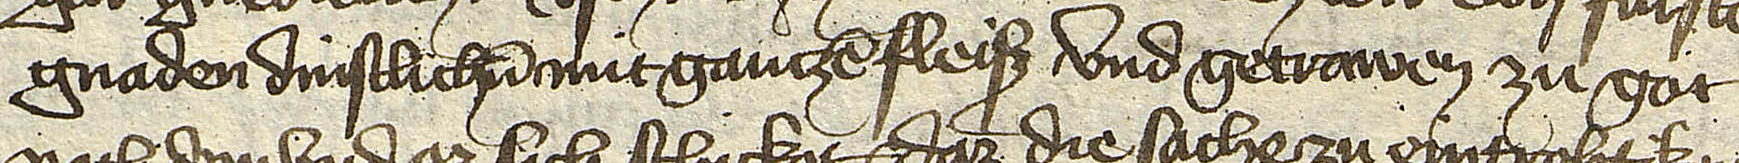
gnaden dinſtlichn* mit gancʒe* fleiſʒ / vnd getrawen cʒu got
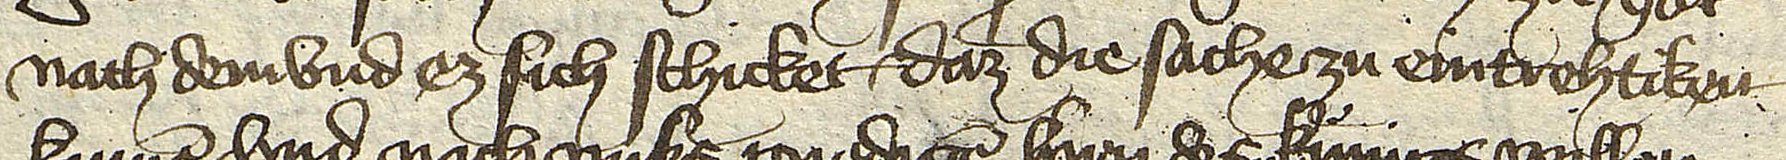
nach dem vnd eʒ ſich ſchicket / daʒ die ſache cʒu eintrehtikeit
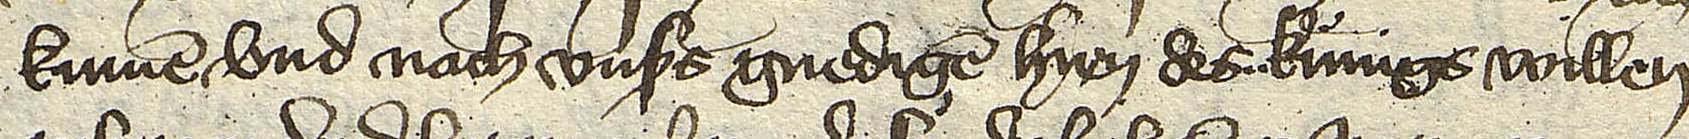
kume* / vnd nach vnſ*s gnedige* h*ren des ~ künig willen
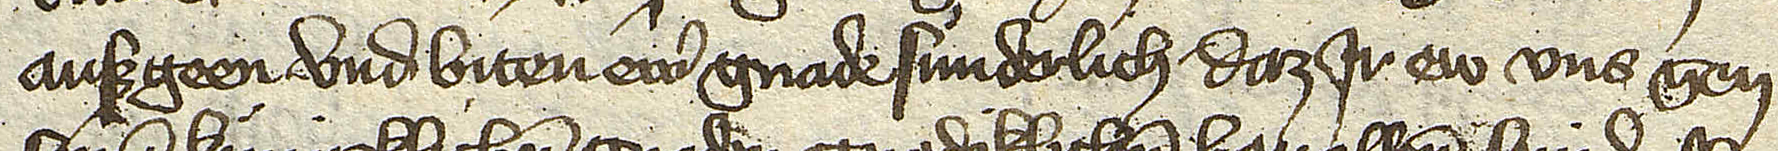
auſʒgeen / vnd biten ew* gnade ſünderlich / daʒ Ir ew vns gen
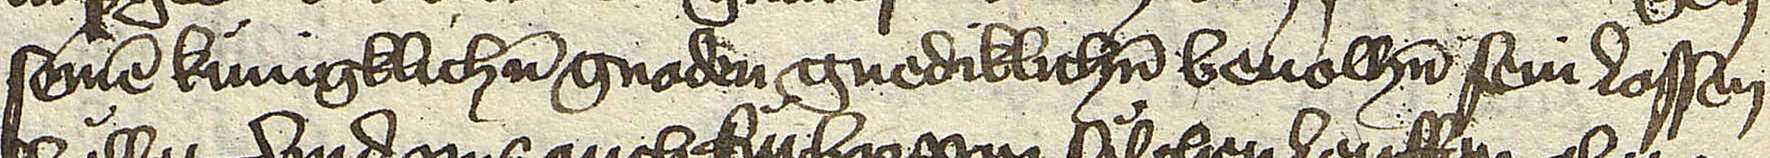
ſeine* küniglichn* gnaden gnediklichn* beuolhn* ſein laſſen
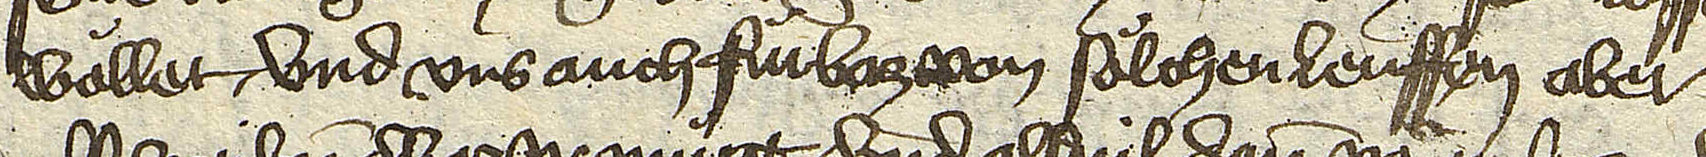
wöllet / vnd vns auch fürbaʒ von ſölichen leuffen aber
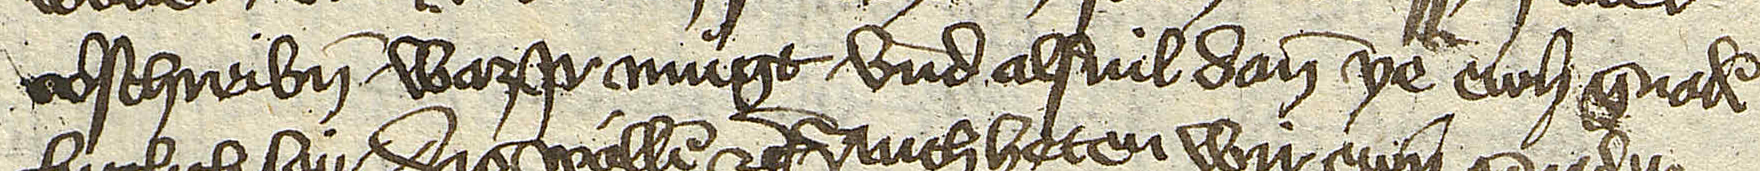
v*ſchreibn / waʒ Ir mügt / vnd alſuil dan* ye ewn* gnad*
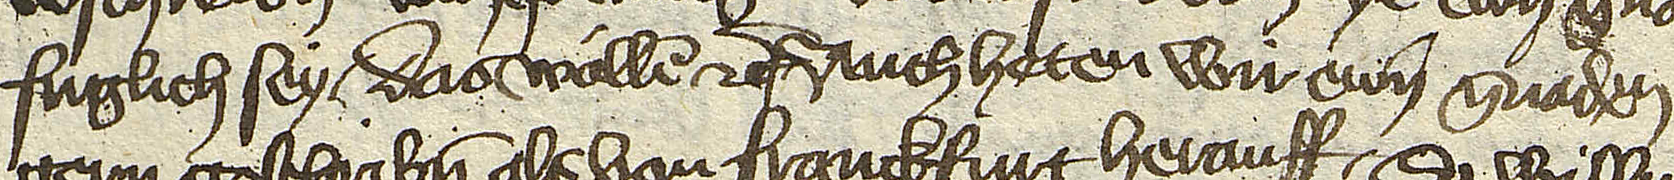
fuglich ſey / Das wölle* ec* Auch heten wir ewn* gnaden
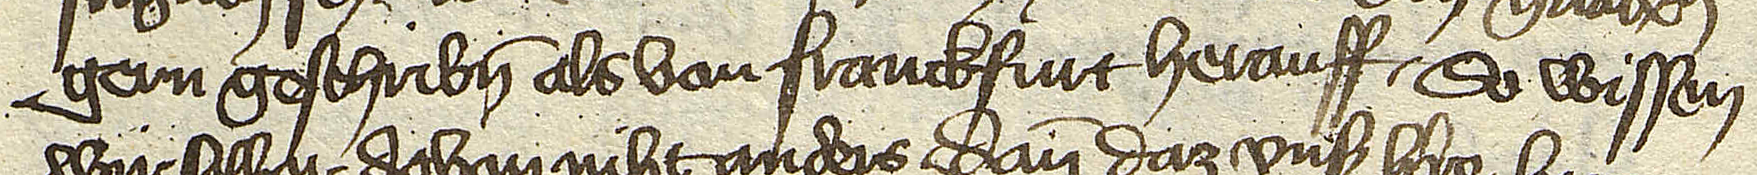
gern geſchribn* als von franckfurt herauff / So wiſſen
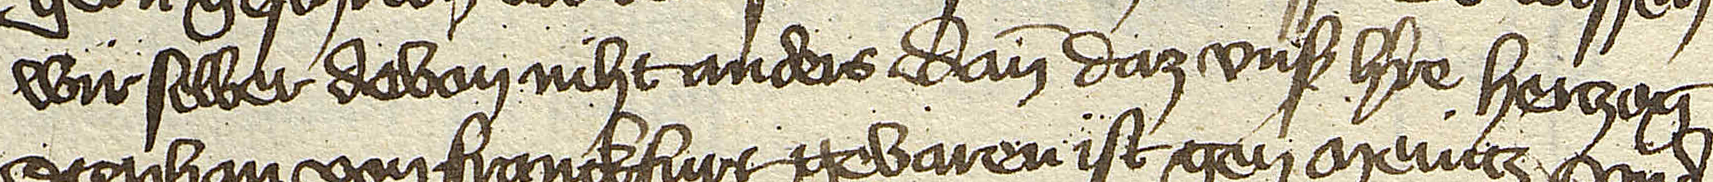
wir ſelber davon niht anders / dan* daʒ vnſ* h*re hercʒog
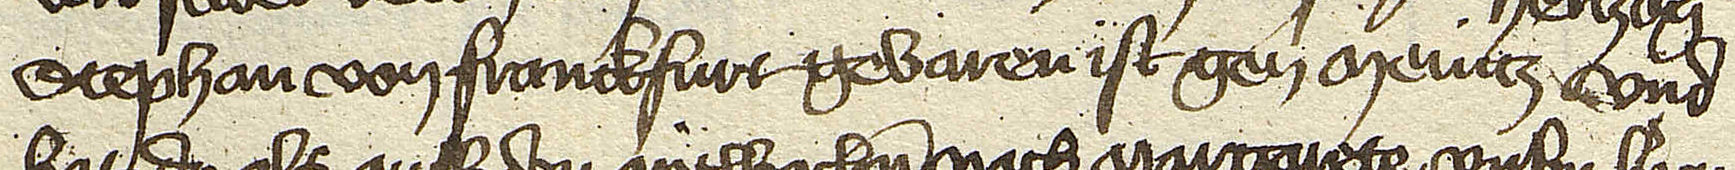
Stephan von franckfurt gevaren iſt gen Meincʒ vnd
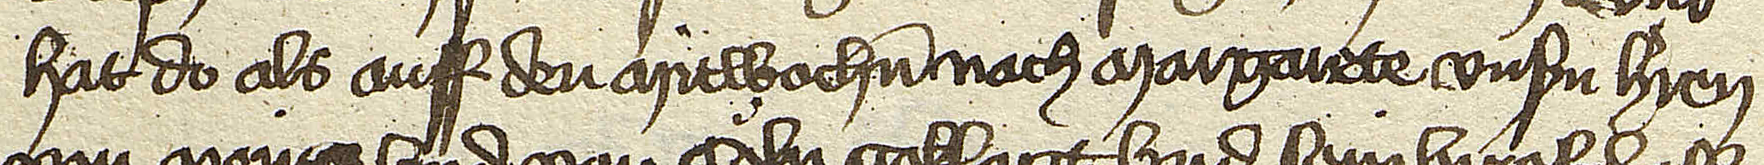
hat do als auff den Mitwochn* nach Margerete vnſ*n h*ren
